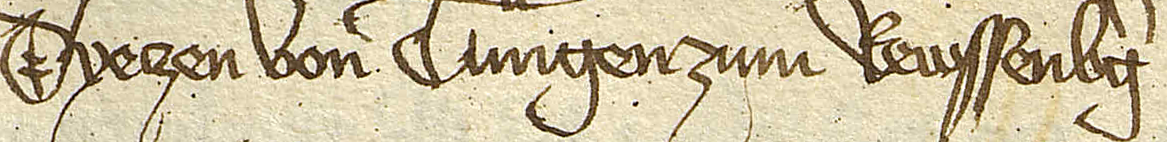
Dycʒen von Tüngen cʒum Rewſſenb*g
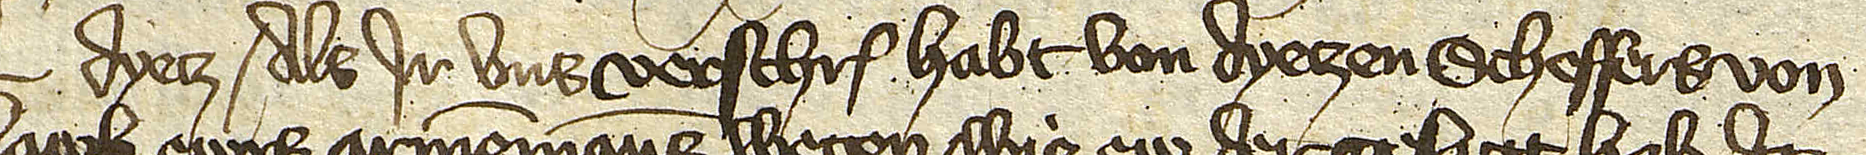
L* dyecʒ / Als Ir vns verſchr* habt von dyecʒen Scheffers von
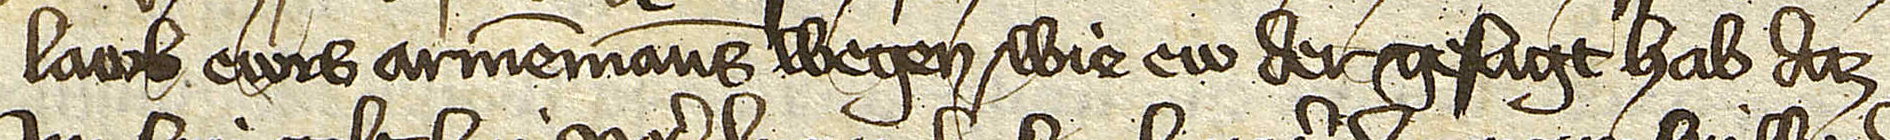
lawb ewrs arme*mans wegen / wie ew der geſagt hab daʒ
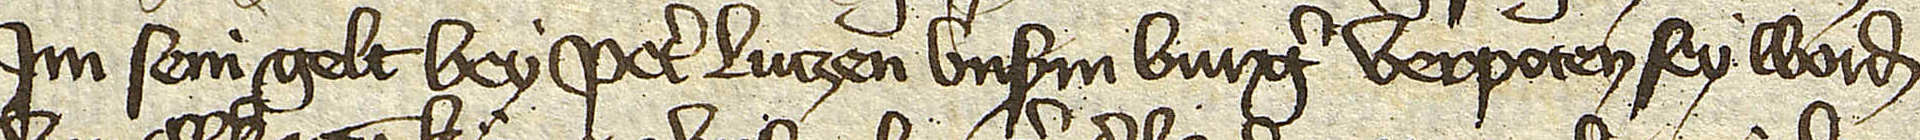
Im ſein gelt bey Pet* Lucʒen vnſ*m burg* verpoten ſey word*
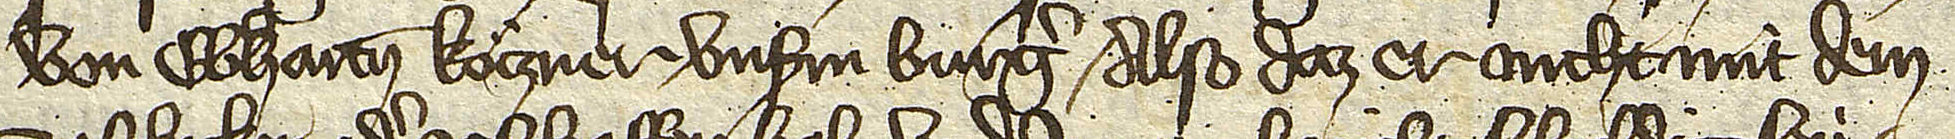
von Ebhartn* köcʒner vnſ*m burg* / Alſo daʒ er nicht mit dem
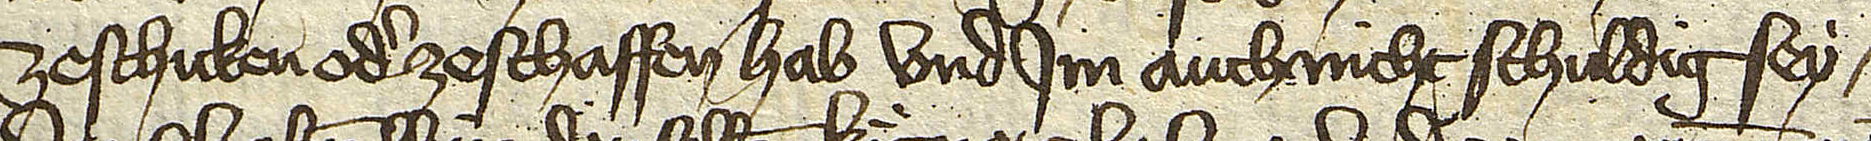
cʒeſchicken od* cʒeſchaffen hab vnd Im auch nicht ſchuldig ſey /
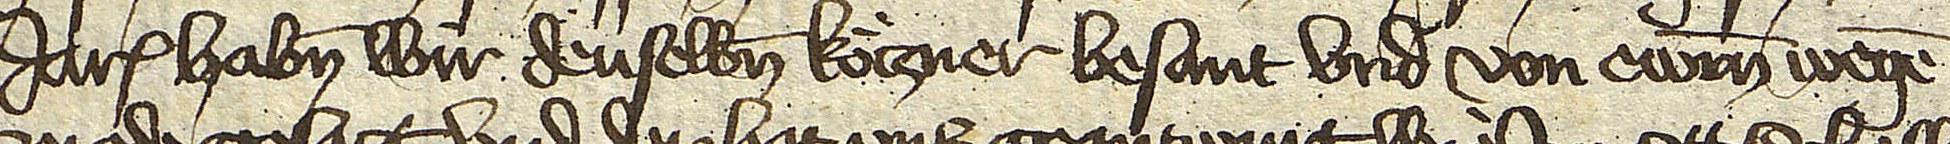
Dar* habn* wir denſelbn* köcʒner beſant vnd von ewrn* wege*
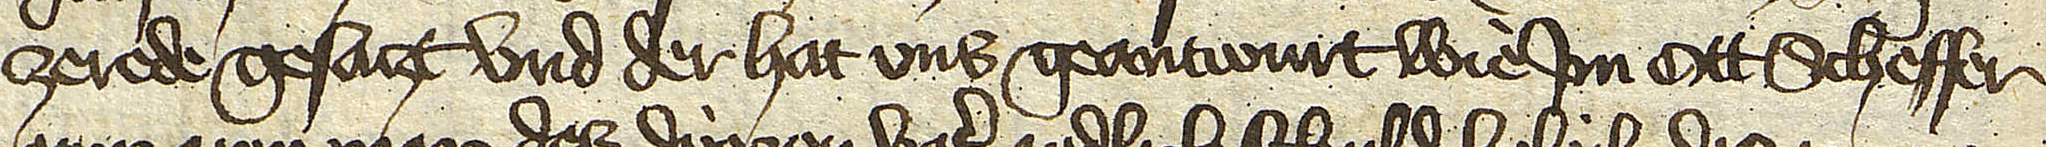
cʒerede geſacʒt vnd der hat vns geantwurt wie Im Ott Scheffer
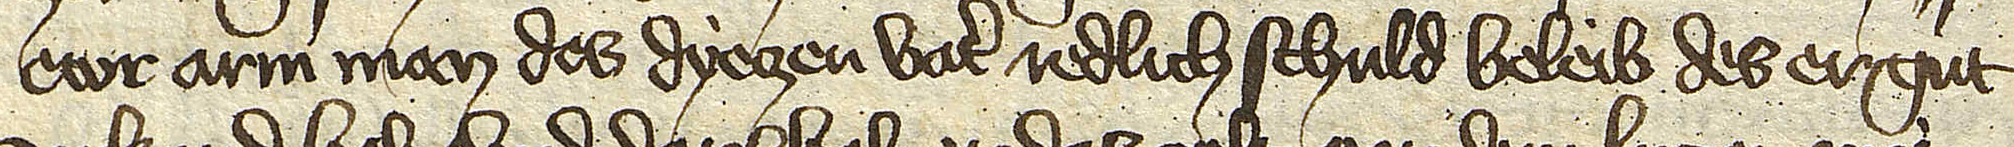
ewr arm man des dyecʒen vat* redlich beleib des er gut
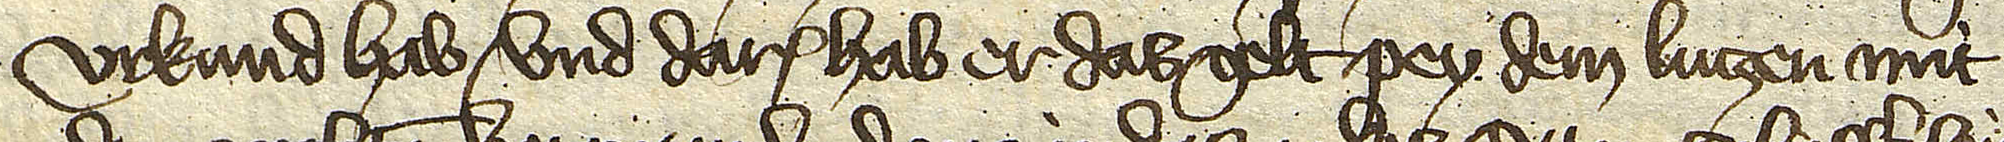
vrkund hab / vnd dar* hab er das gelt pey dem lucʒen mit
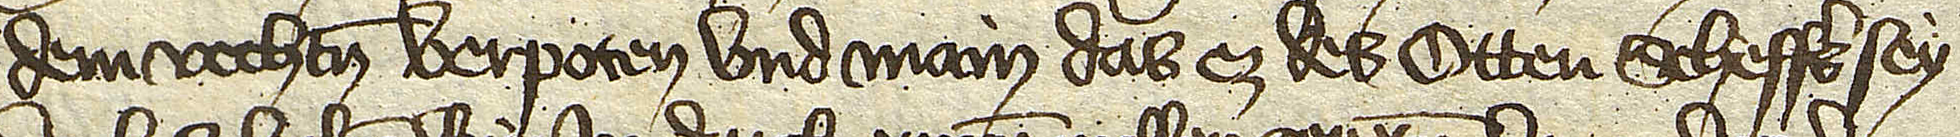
dem rechtn* verpoten vnd main das eʒ des Otten Scheffs* ſey
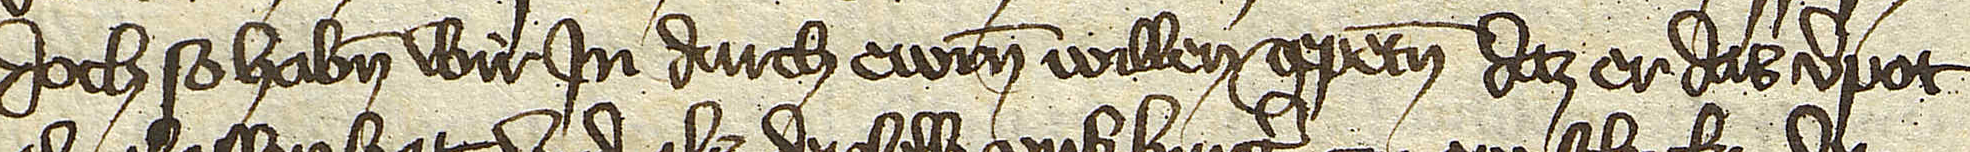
doch ſo habn* wir In durch ewrn* willen gepetn* daʒ er das v*pot
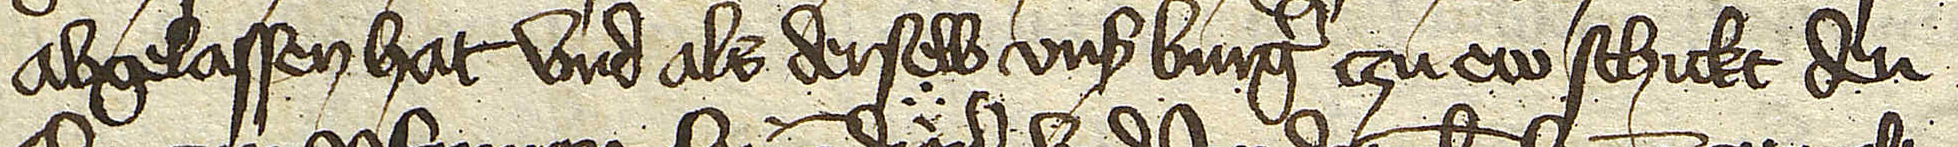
abgelaſſen hat vnd als derſelb vnſ* burg* cʒu ew ſchickt den
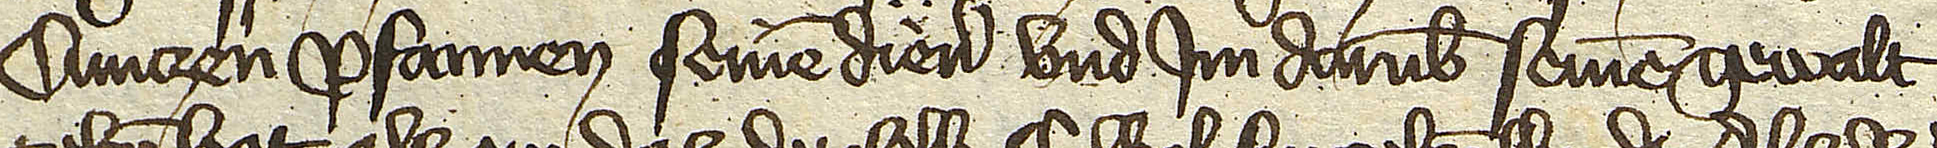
Cuncʒen Pfannen ſeine* dien* vnd Im darub* ſeine* gewalt
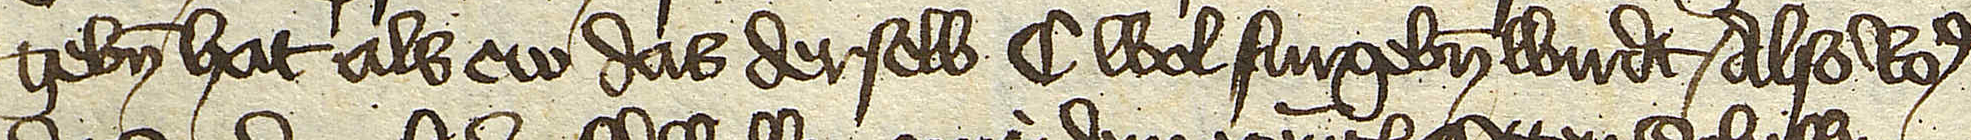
gebn* hat als ew das derſelb C wol furgebn* wirdt / Alſo Ro*
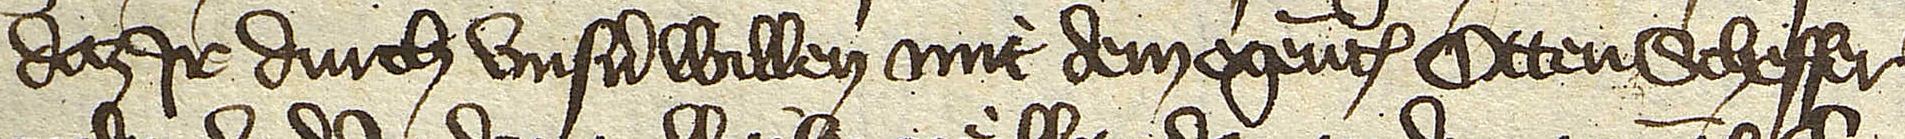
daʒ Ir durch vnſn* willen mit dem egent* Otten Scheffer
